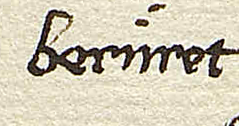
berüret
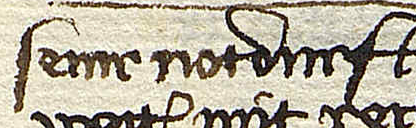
ſeinr notdurft
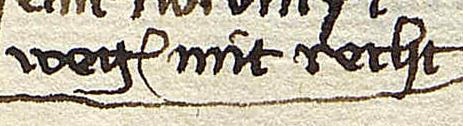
weg* mit recht
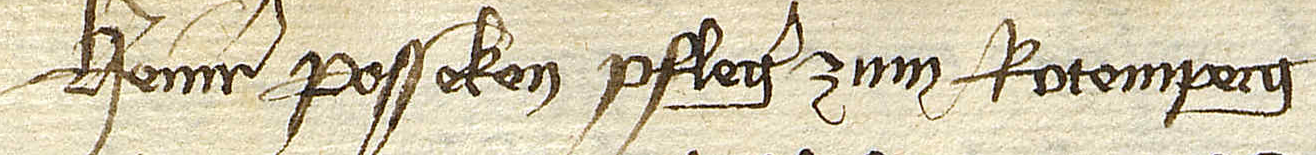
Heinr* Poſſeken pfleg* ʒum Rotemperg
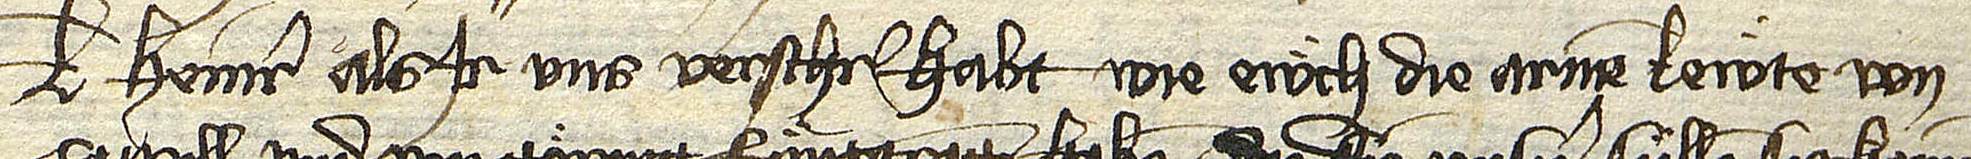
L* heinr* als Ir vns verſchr* habt wie ewch die arme* lewte von
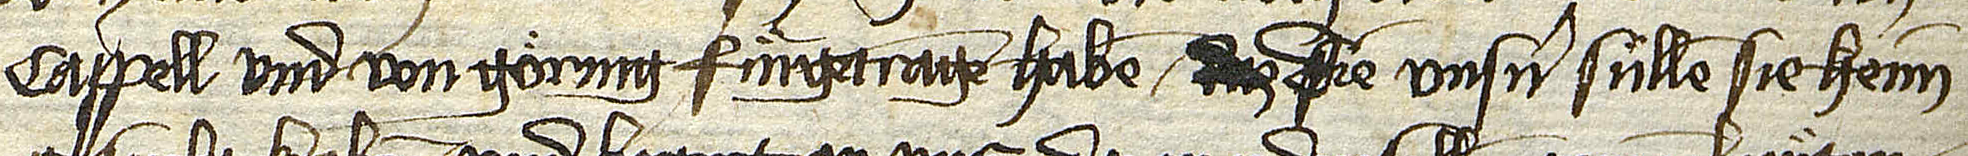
Cappell vnd von görnig fürgetrage* habe* / daʒ die vnſ*n ſülle* ſie heim
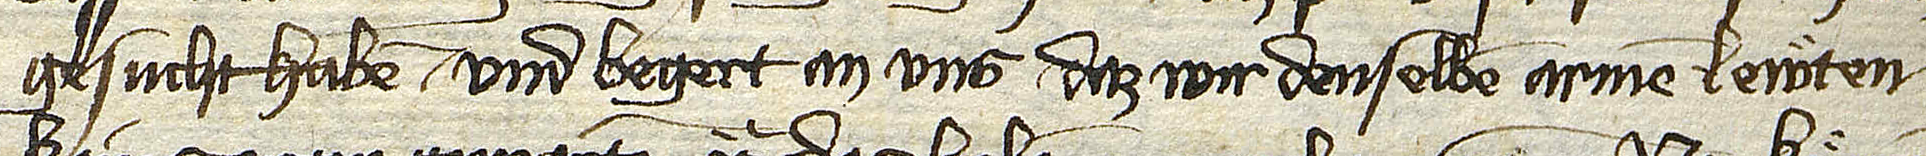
geſucht habe* / vnd begert an vns / daʒ wir denſelbe* arme* lewten
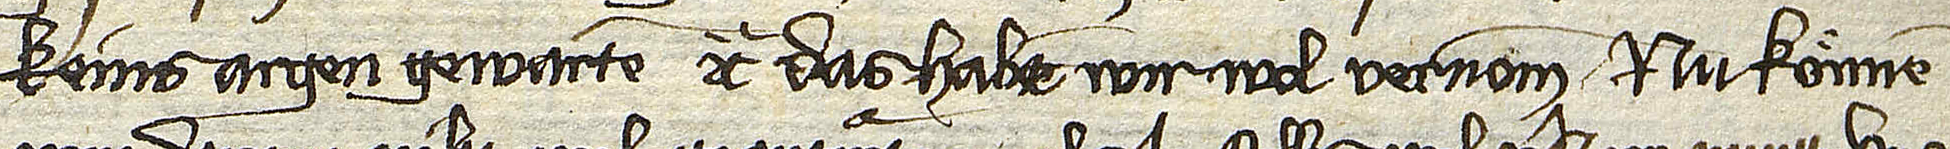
keins argen gewarte* ec* Das habe* wir wol vernom* / Nu könne*
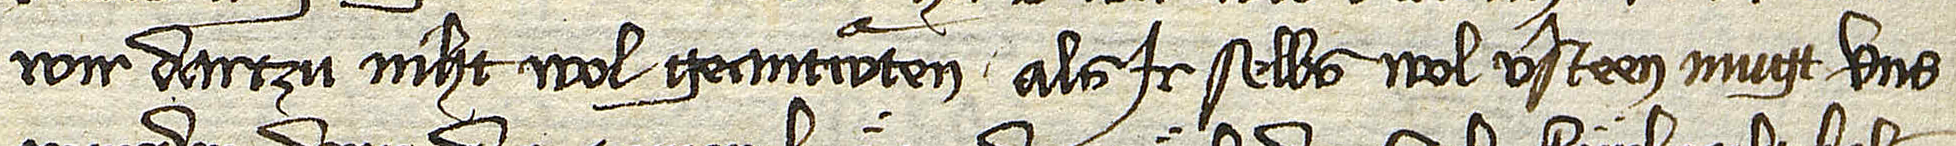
wir darcʒu niht wol geantw*ten als Ir ſelbs wol v*ſteen mugt / Vns
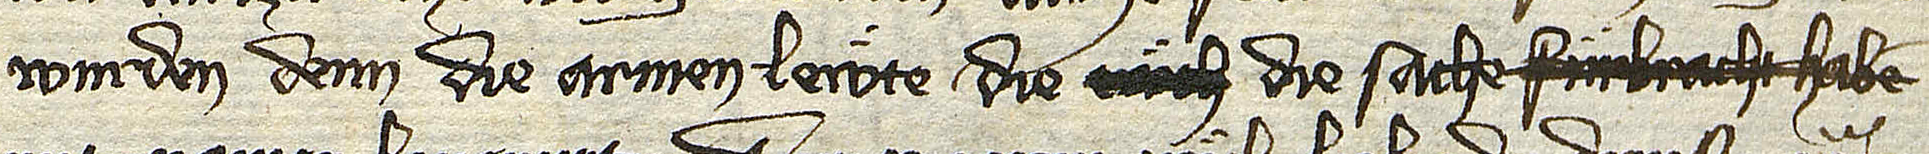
wurden denn die armen lewte / die ewch die ſache fürbracht habe*
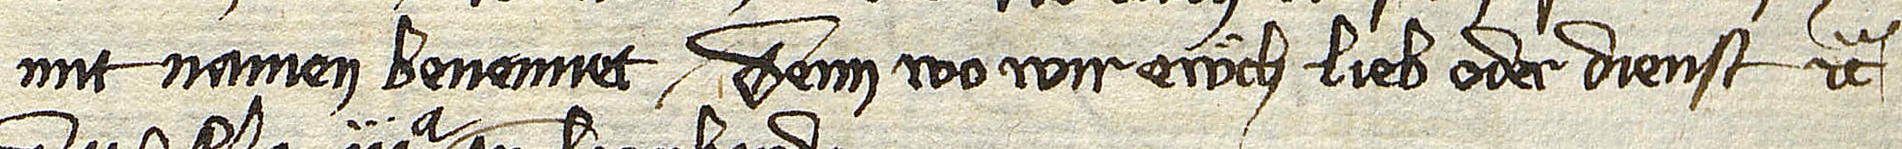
mit namen benennet / Denn wo wir ewch lieb oder dienſt ec*
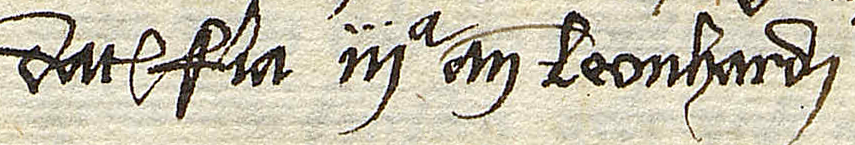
Dat* fia* iii* an* Leonhardi
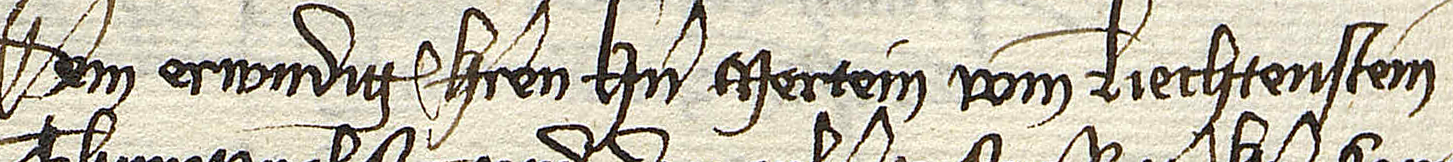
Dem erwirdig* h*ren H*n Mertein vom* Liechtenſtein
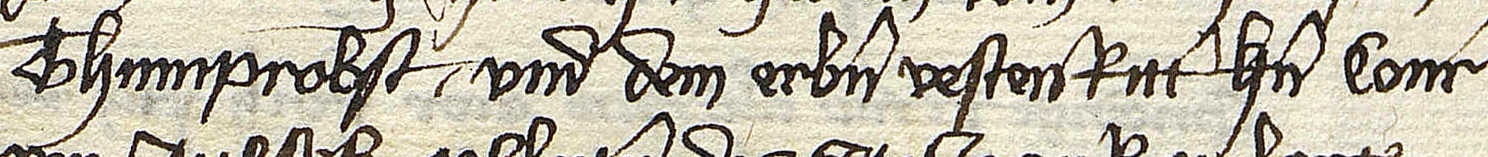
Thumprobſt / vnd dem erb*n veſten Ritt* H*n Conr*
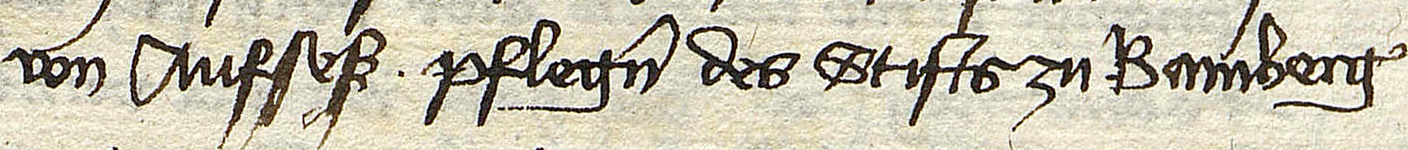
von Aufſeſʒ . Pfleg*n des Stifts ʒu Bamberg
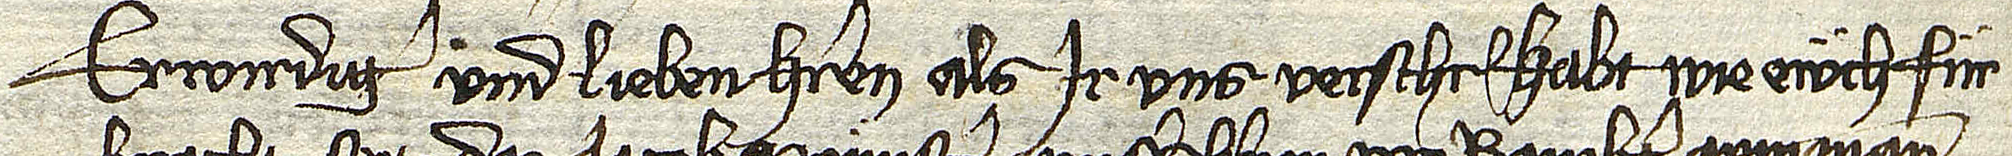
Erwirdig* vnd lieben h*ren als Ir vns verſchr* habt wie ewch für -
